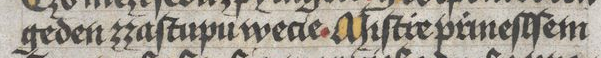geden zzaſtupu wecie.Miſtṙe pṙineſlſem
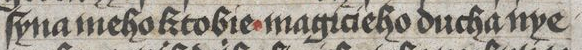ſyna meho ktobie.magícíeho ducha nye¬
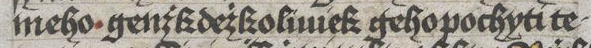nieho.genž kdeżkoliuek geho pochytí te¬
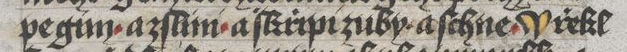pe gím.a zſliní.a ẛkṙipí zuby.a ſchne.Yřekl
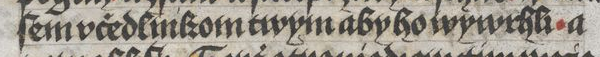ſera včedlnikom twym aby ho wywrhli.a
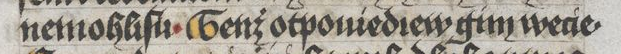nemohliſu.Genż otpouiediew gim wecie.
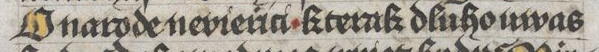O narode nevieṙící.kterak dluho uwas
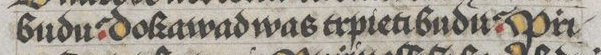budu?Dokawad wás trpieti budu? Pṙi¬
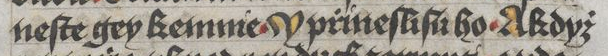neſte gey kemnie.Y pṙineẛliſu ho.A kdyż
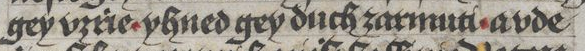gey vzṙie.yhned gey duch zarmuti.a vde¬
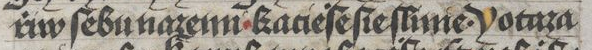ṙiw ſebu na zemi.kacíeẛe ſie ſlinie.Y otaza
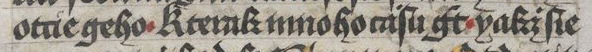otcie geho.Kterak mnoho caẛu ḡt.yakž ſie
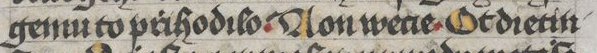gemu to pṙihodilo?A on wecie.Ot dietin¬
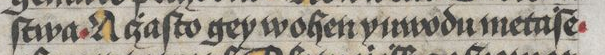ſtwa.A cżaſto gey wohen y wodu metaẛe.
